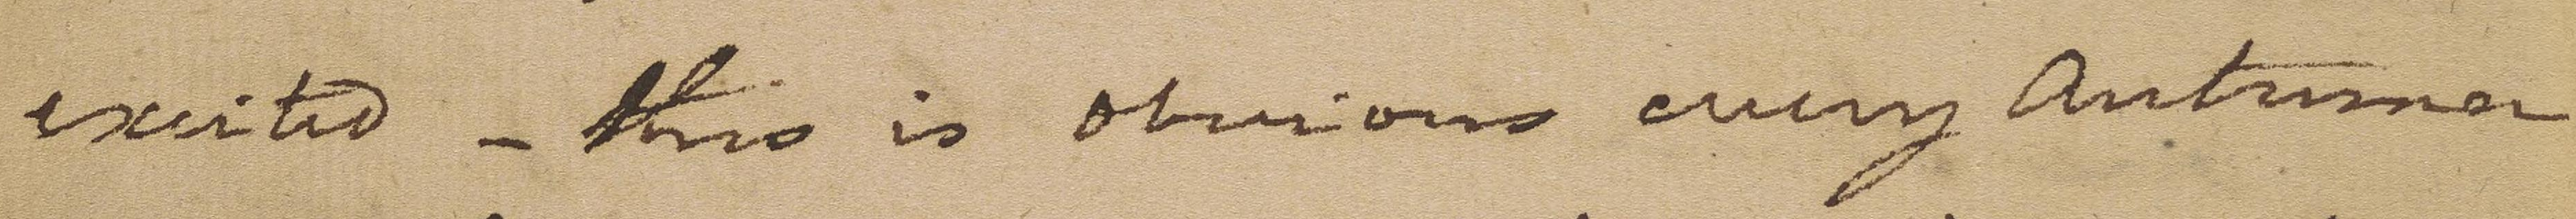excited- this is obvious every Autumn
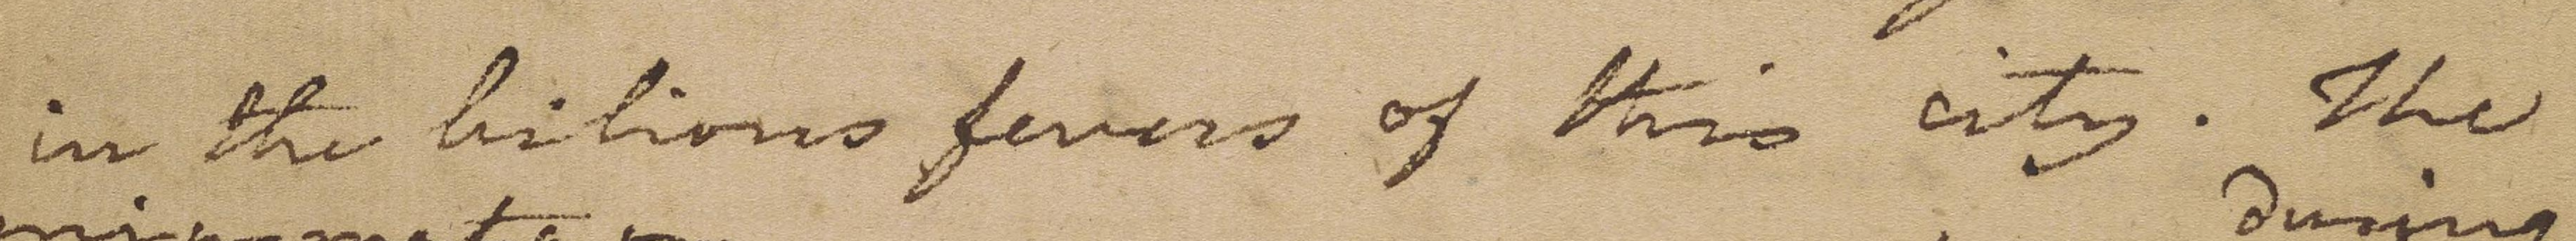in the bilious fevers of this city. The
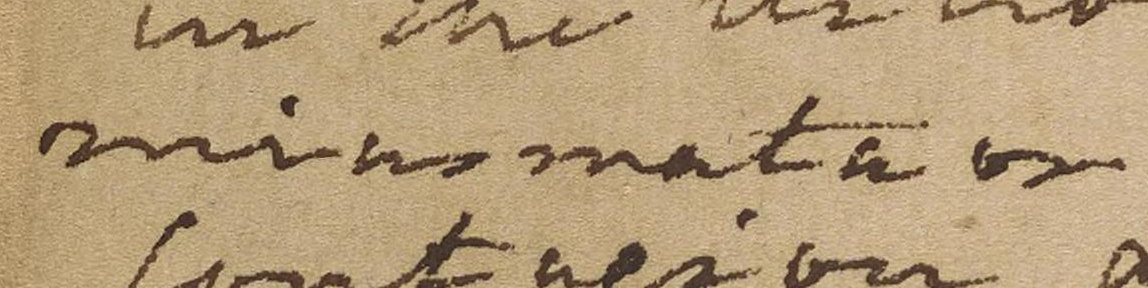miasmata or
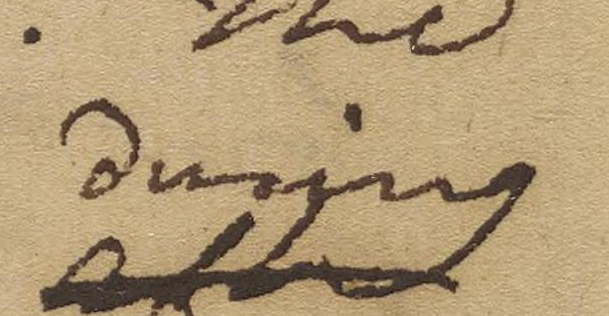during
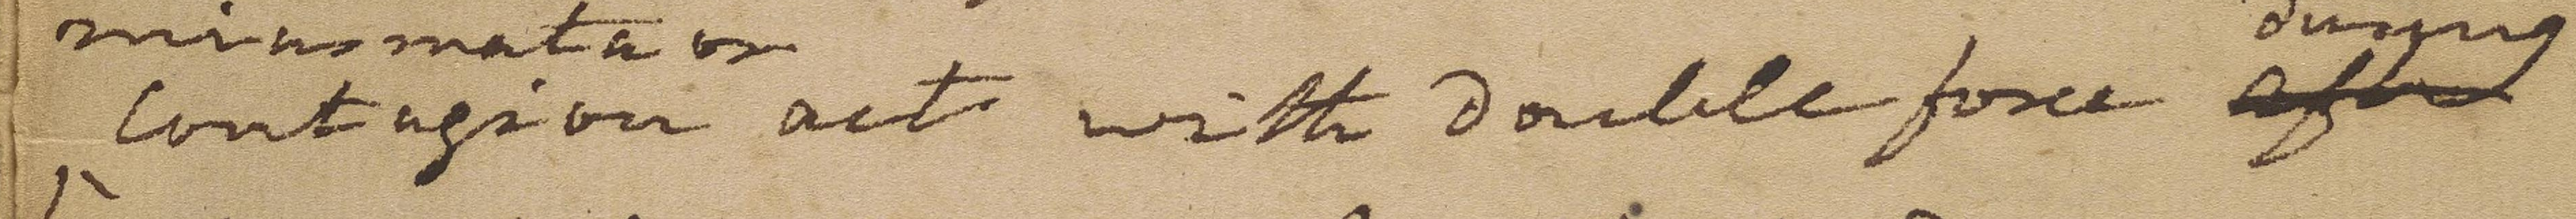^ contagion act with double force [after]
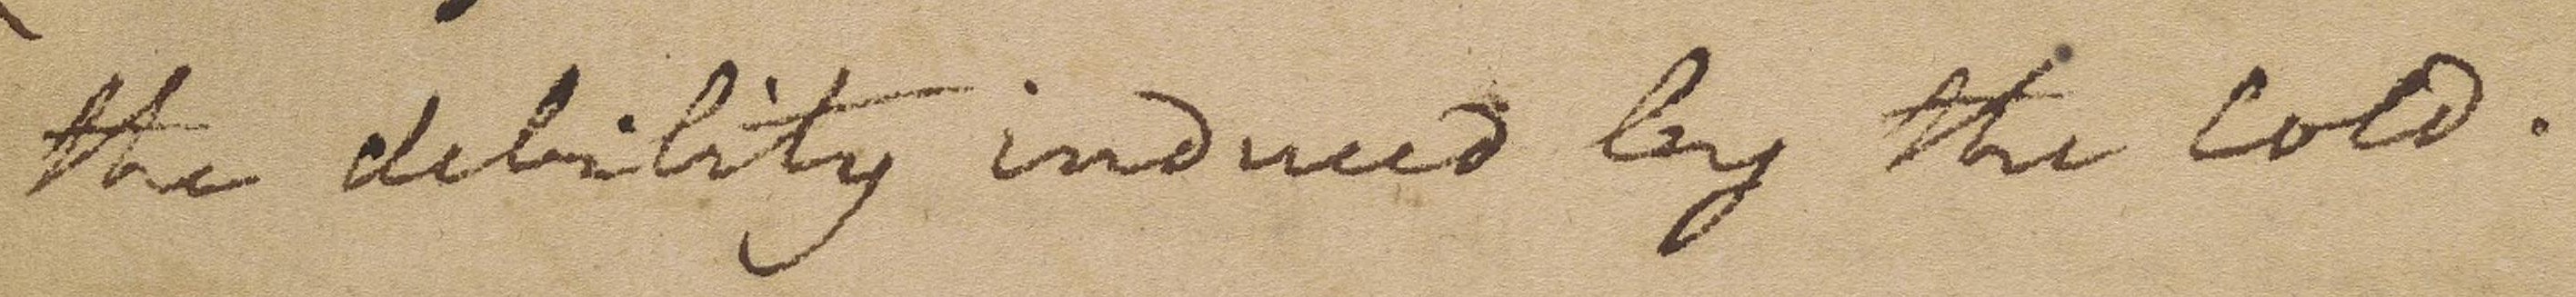the debility induced by the cold
